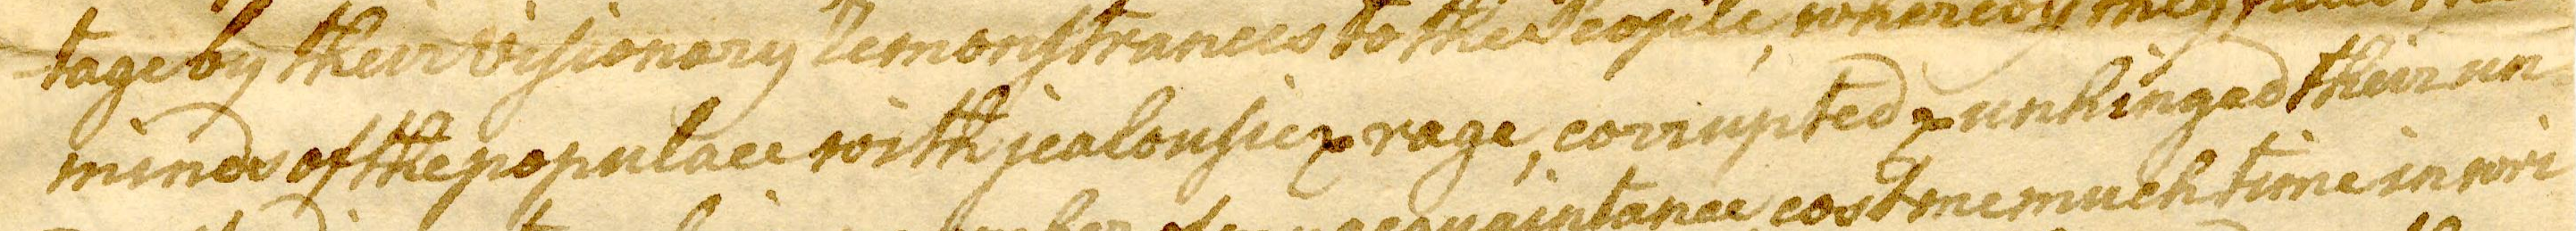minds of the populace with jealousie & rage, corrupted, unhinged their un
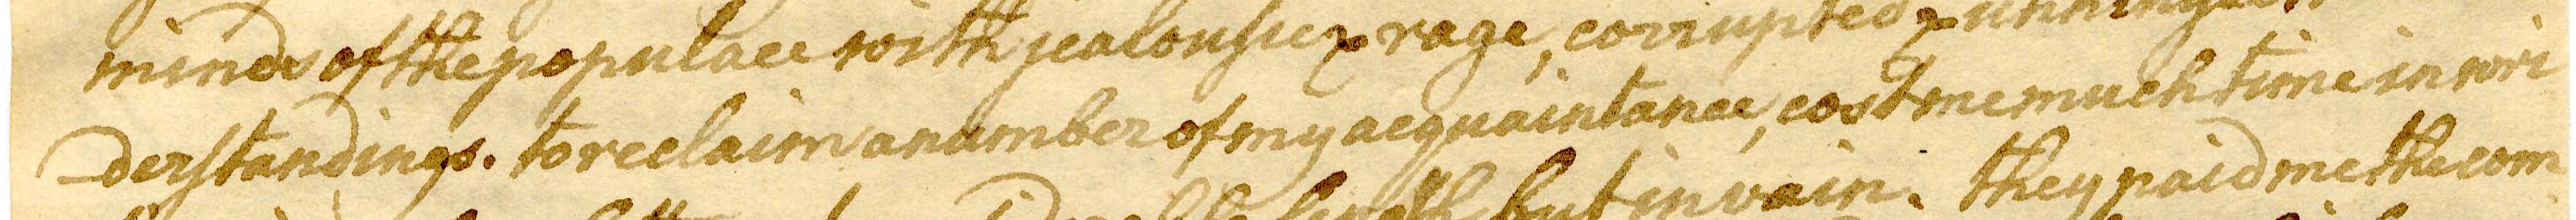-derstandings. to reclaim a number of my acquaintance, cost me much time in wri
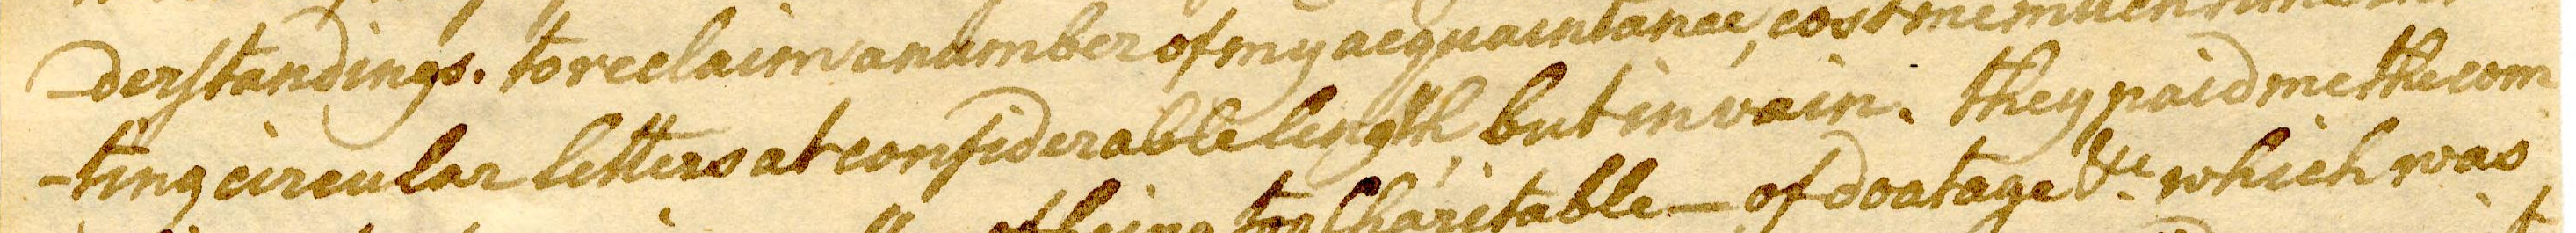-ting circular letters at considerable length but in vain: They paid me me the com
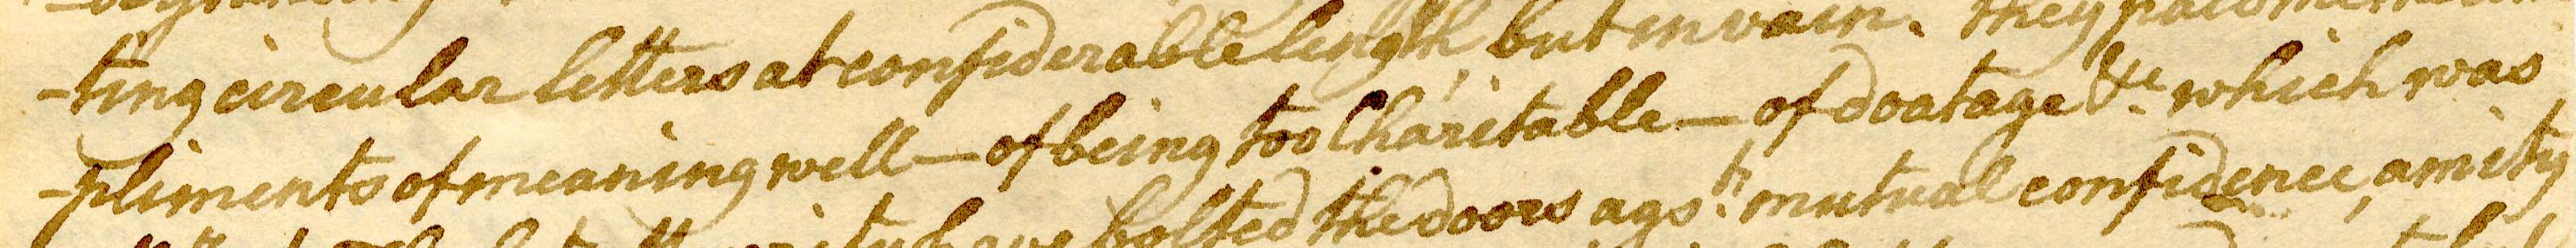-pliments of meaning well- of being too Charitable- of doatage &^c. which was
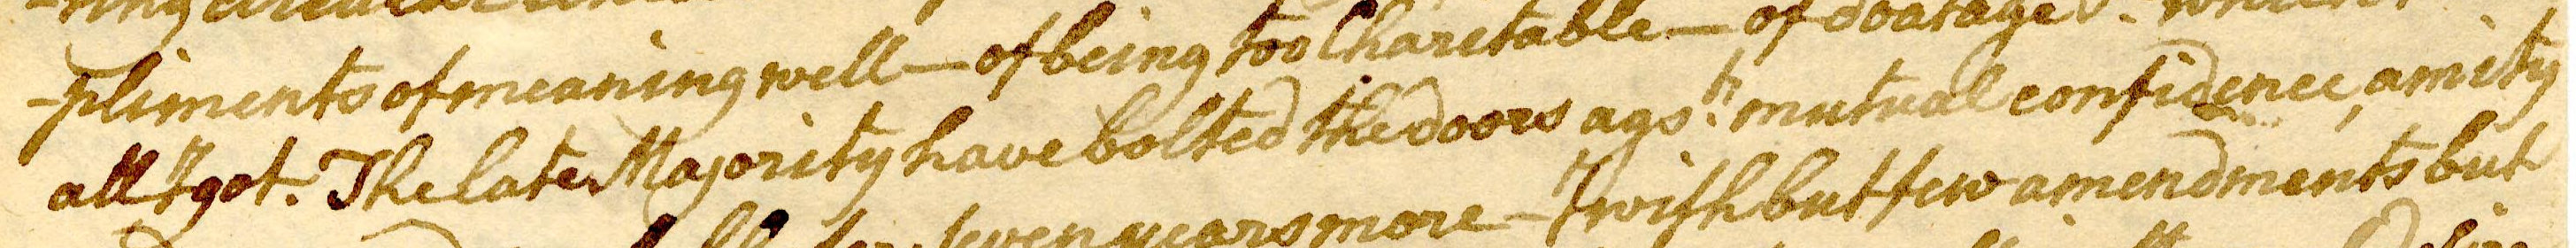all I got. The late Majority have bolted the doors ags^t. mutual confidence, amity
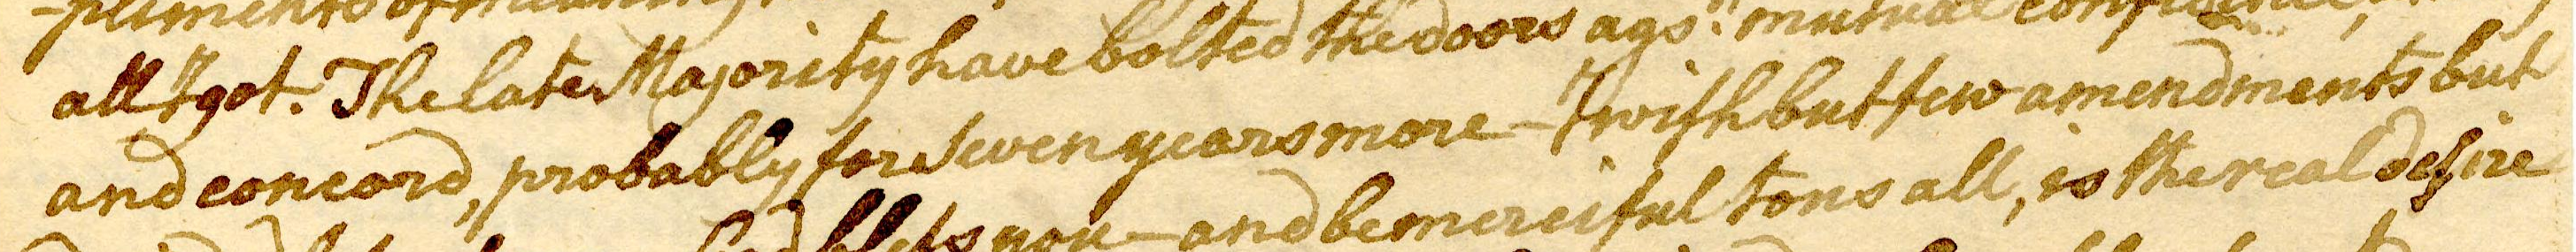and concord, probably for Seven years more (I wish but few amendments but
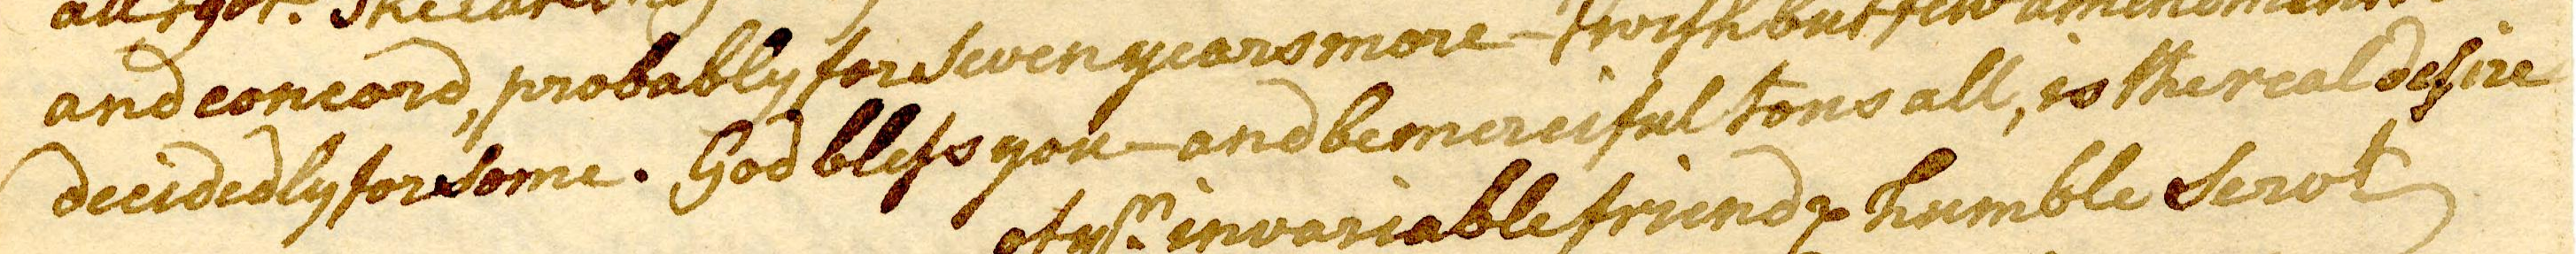decidedly for some. God bless you-and be merciful to us all, is the real desire
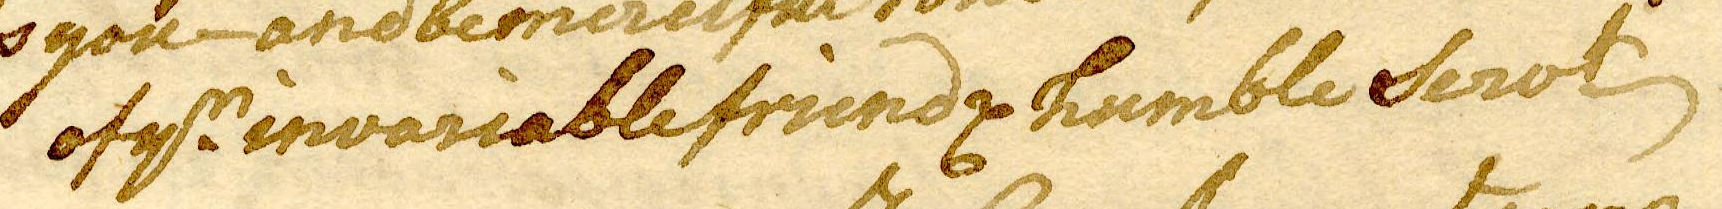of y^r. invariable friend & humble Serv^t
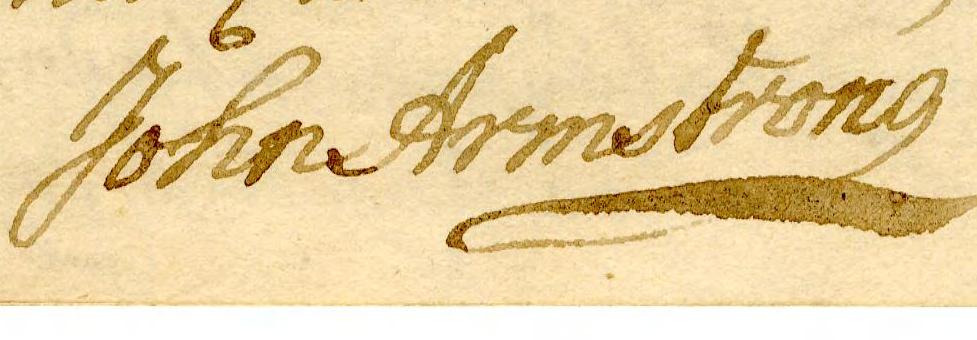John Armstrong
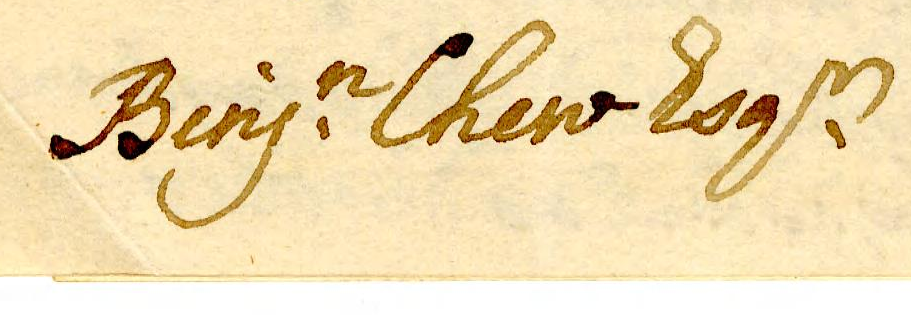Benj^n. Chew Esq^r.
